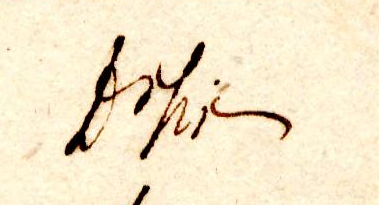D^r Sir
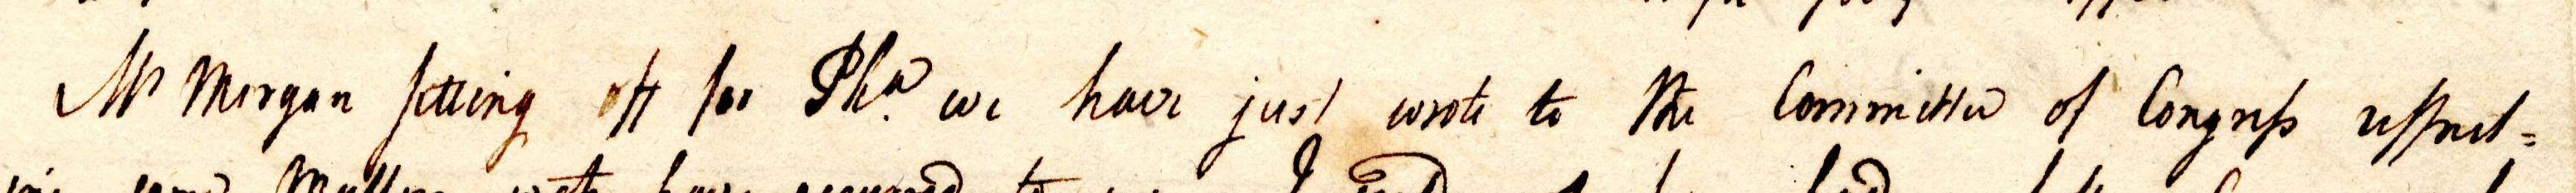M^r. Morgan setting off for Ph^a. we have just wrote to the Committee of Congress respect-
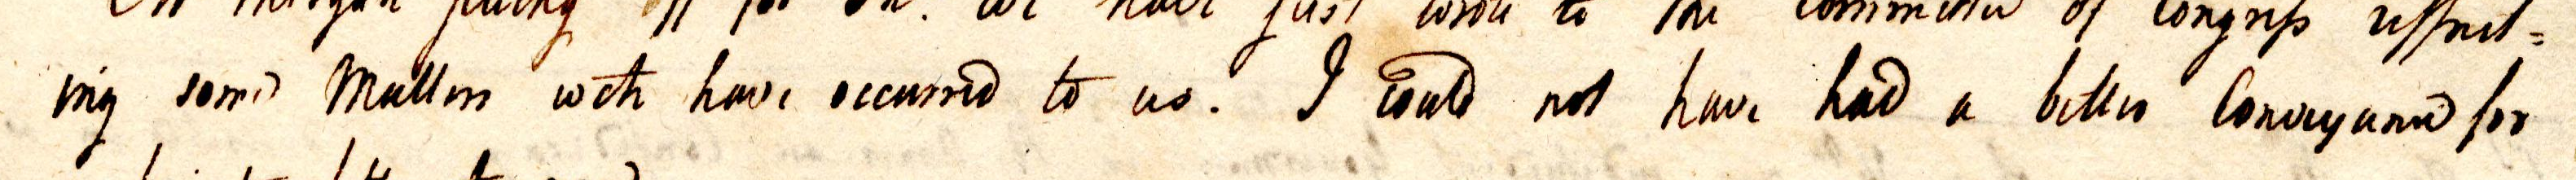ing some Matters wch have occurred to us. I could not have had a better Conveyance for
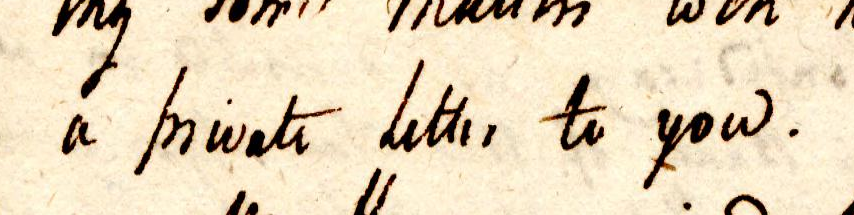a private letter to you.
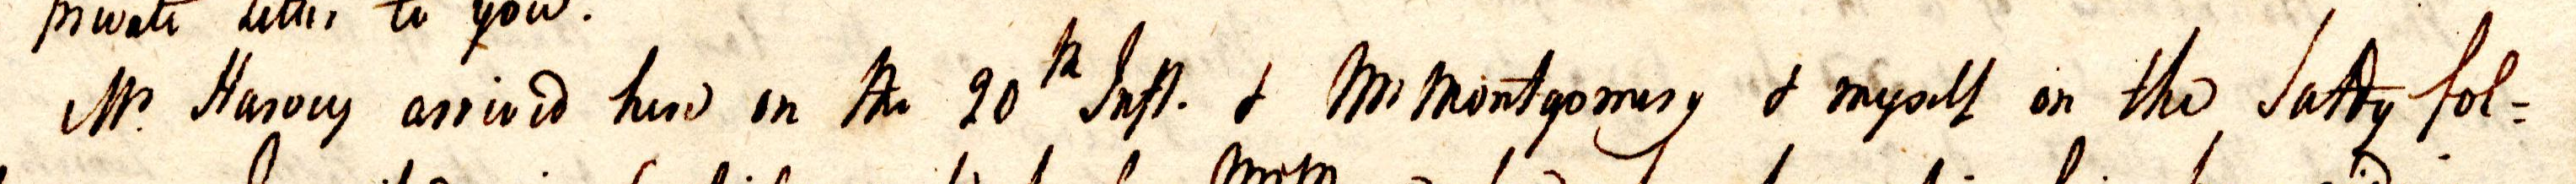Mr Harvey arrived here in the 20^th Inst. & M^r Montgomery, & myself on the Satdy fol-
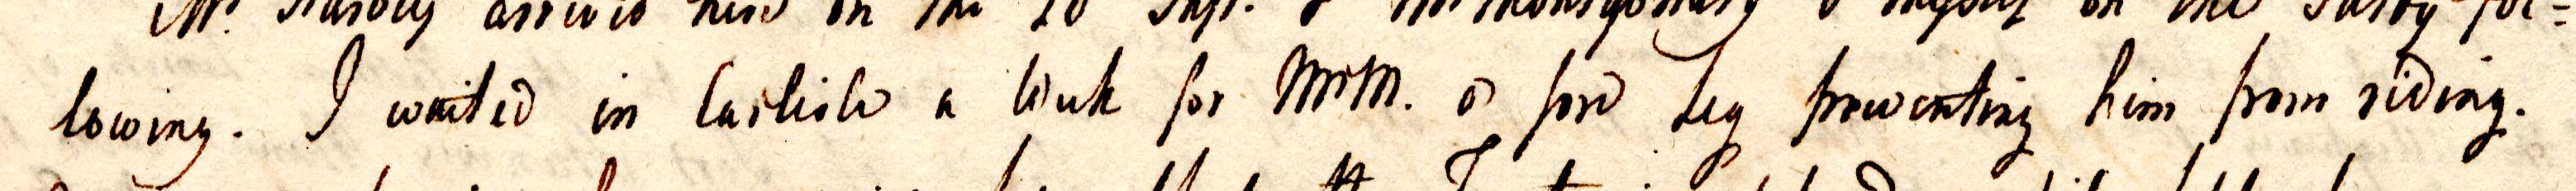lowing. I waited in Carlisle a wink for M^r M. a sore leg preventing him from riding.
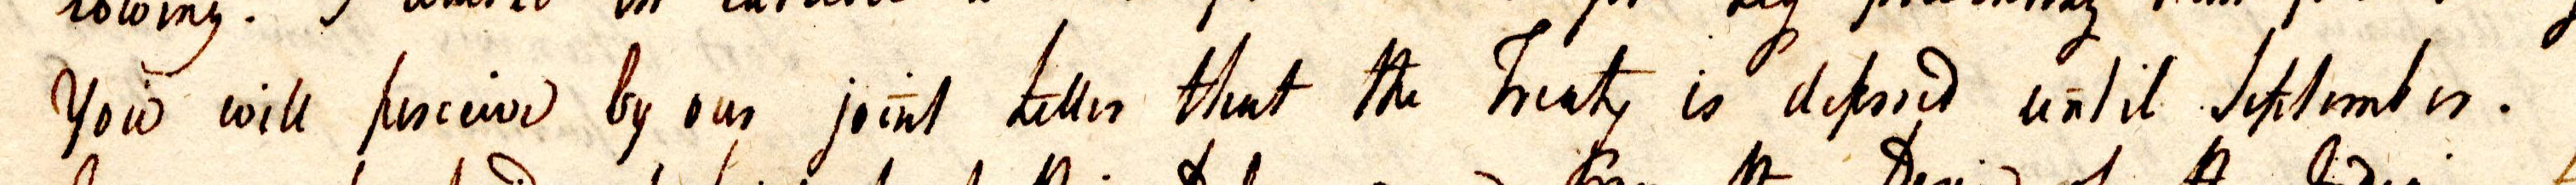You will perceive by our joint Letter that the Treaty is deposed until September.
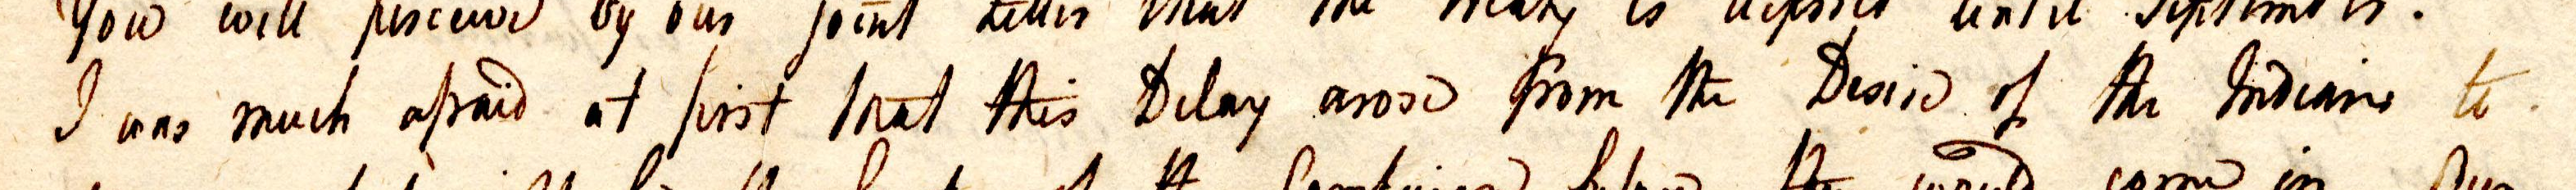I was much afraid at first that this Delay arose from the Desire of the Indians to
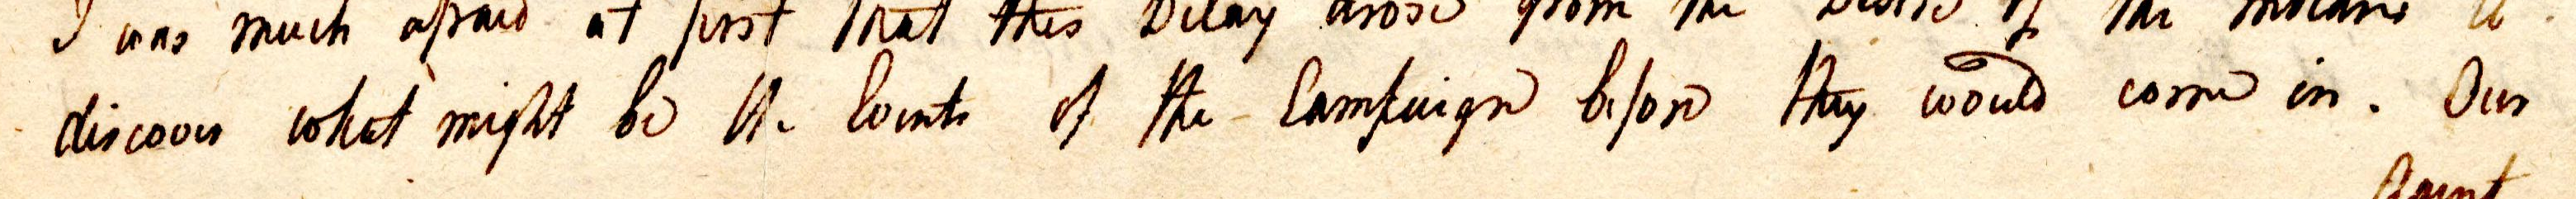discover what might be the events of the Campaign before they would come in. Our
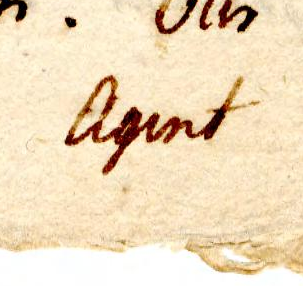Agent
